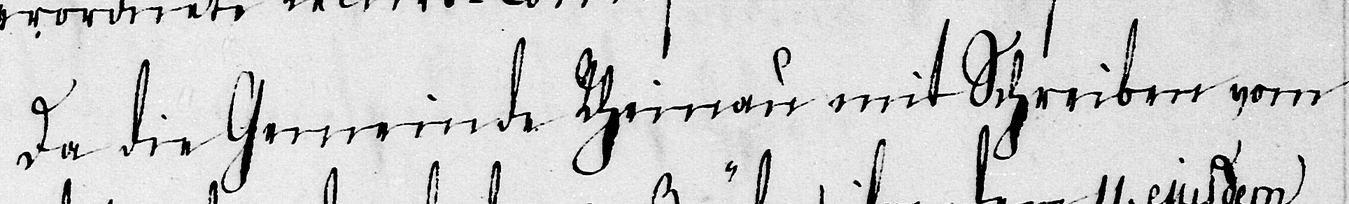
Da die Gemeinde Rheinau mit Schreiben vom
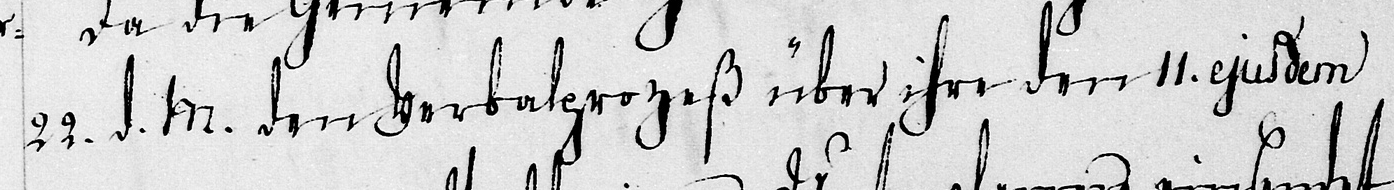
22. d. M. den Verbalproceß über ihre den 11. ejusdem
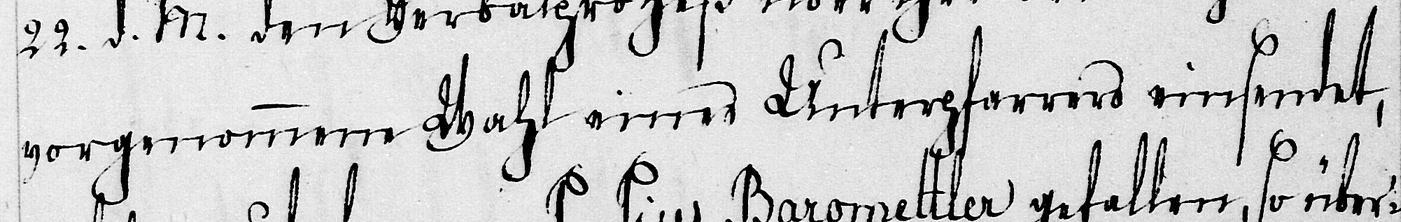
vorgenommene Wahl eines Unterpfarrers einsendet,
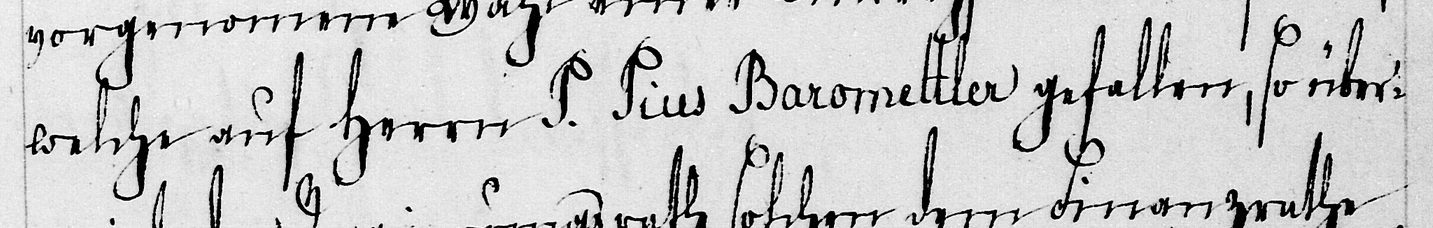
welche auf Herrn P. Pius Baromettler gefallen, so übe¬
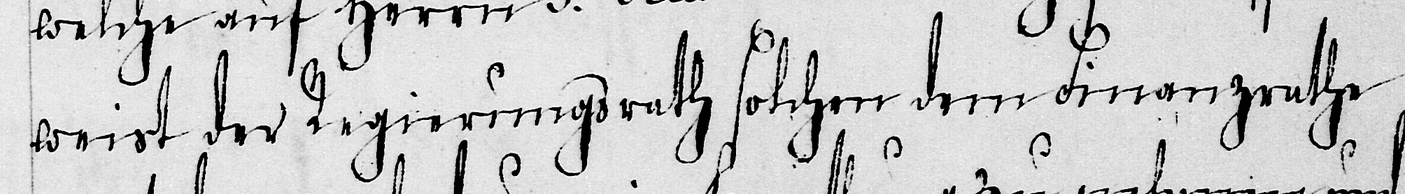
rweist der Regierungsrath solchen dem Finanzrathe
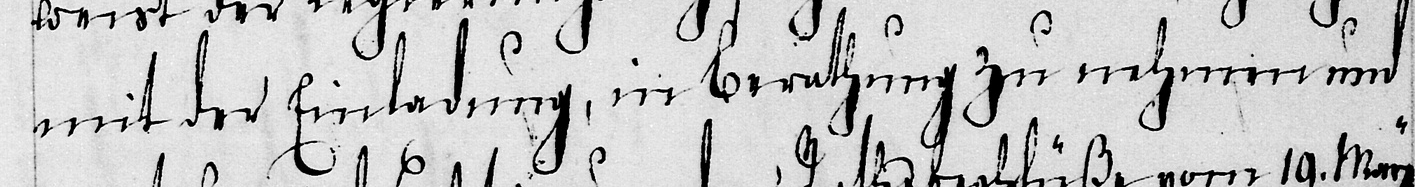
mit der Einladung, in Berathung zu nehmen und
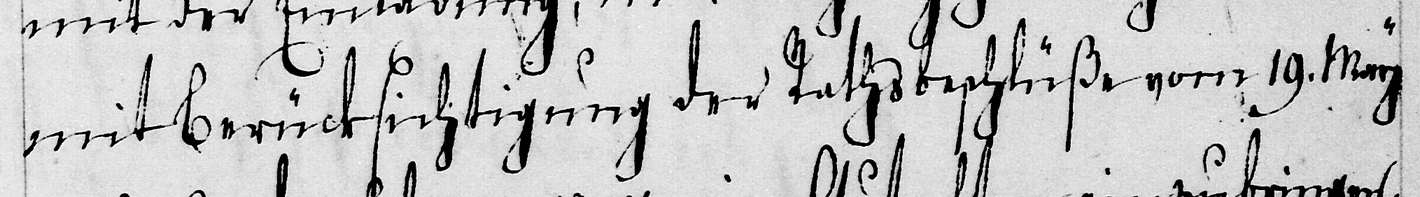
mit Berücksichtigung der Rathsbeschlüße vom 19. May
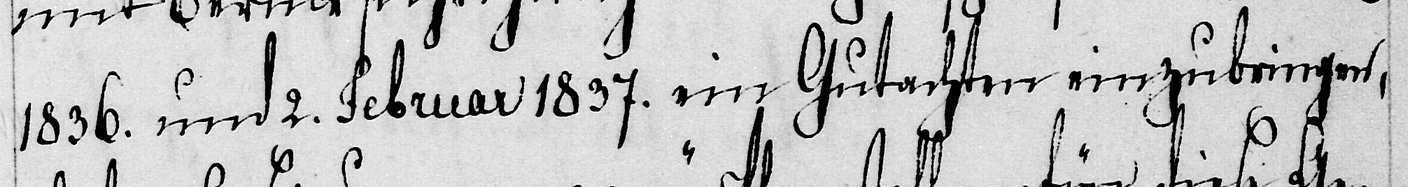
1836. und 2. Februar 1837. ein Gutachten einzubringen,
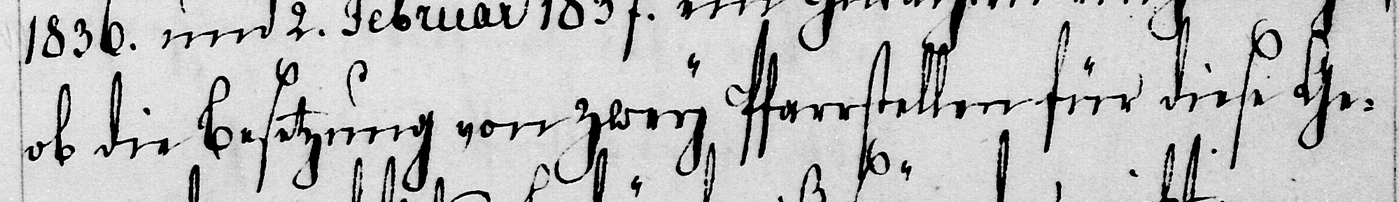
ob die Besetzung von zwey Pfarrstellen für diese Ge¬
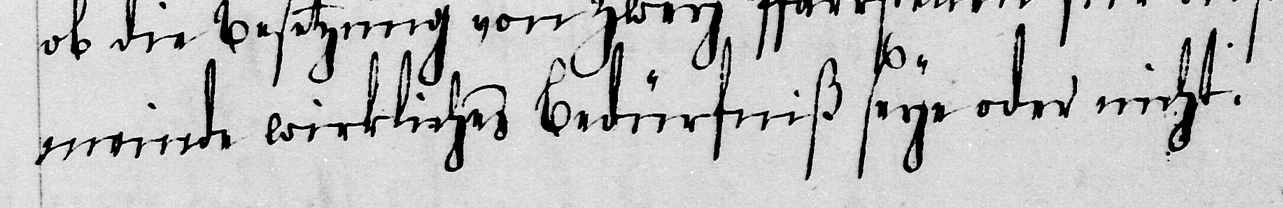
meinde wirkliches Bedürfniß seye oder nicht.
